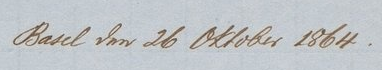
Basel den 26 Oktober 1864.
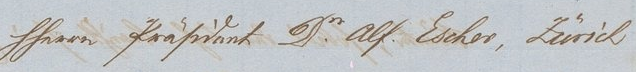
HHerrn Präsident Dr Alf. Escher, Zürich
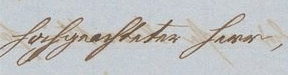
Hochgeachteter Herr,
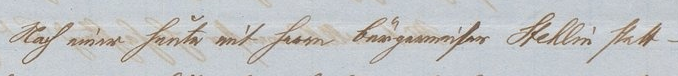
Nach einer heute mit Herrn Bürgermeister Stehlin statt-
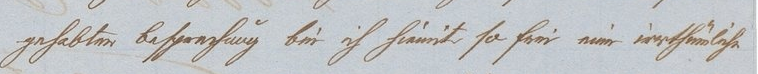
gehabten Besprechung bin ich hiemit so frei eine irrthümliche
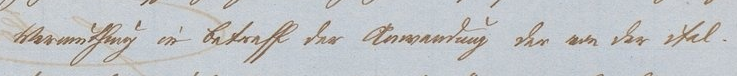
Vermuthung in Betreff der Anwendung der von der ital.
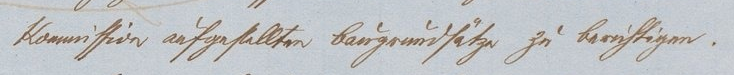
Kommission aufgestellten Baugrundsätze zu berichtigen.
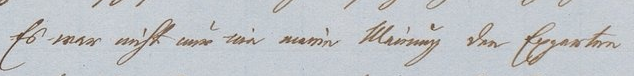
Es war nicht nur nie meine Meinung den Experten
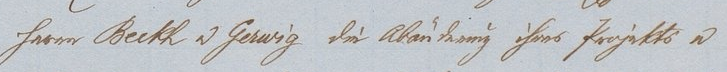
Herrn Beckh & Gerwig die Abänderung ihres Projekts &
